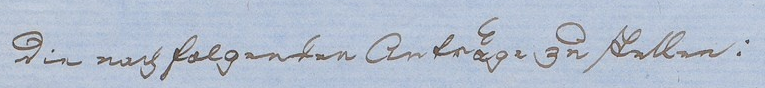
die nachfolgenden Anträge zu stellen:
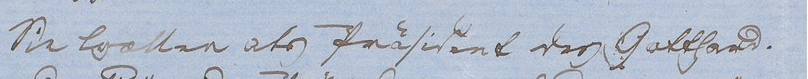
Sie wollen als Präsident des Gotthhard -
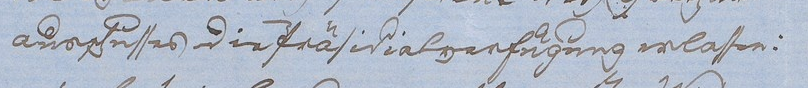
ausschusses die Präsidialverfügung erlassen:
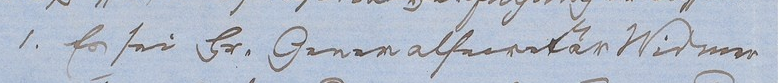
1. Es sei Hr. Generalsecretär Widmer
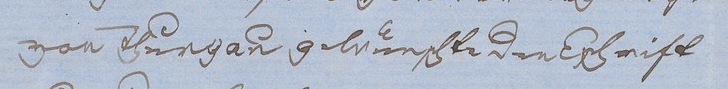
von Thurgau gewünschte Denkschrift
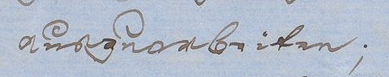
auszuarbeiten;
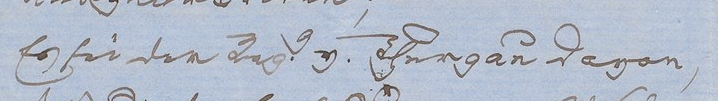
Es sei der Regg v. Thurgau davon,
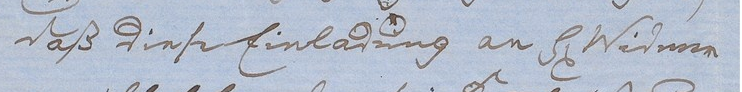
daß diese Einladung an H. Widmer
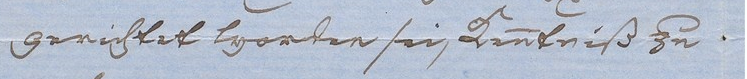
gerichtet worden sei, Kenntniß zu
